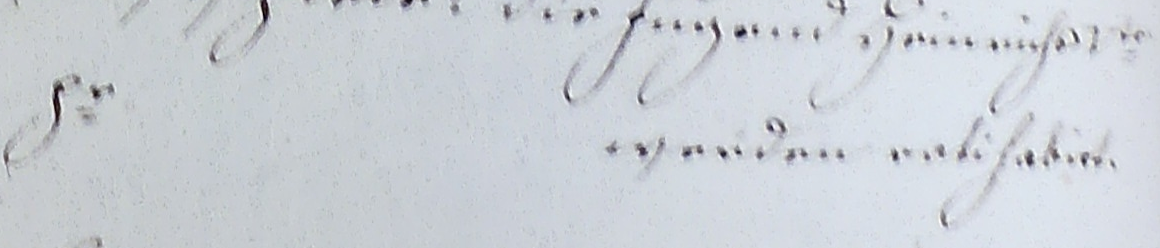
pr͇. werden ratihabirt.
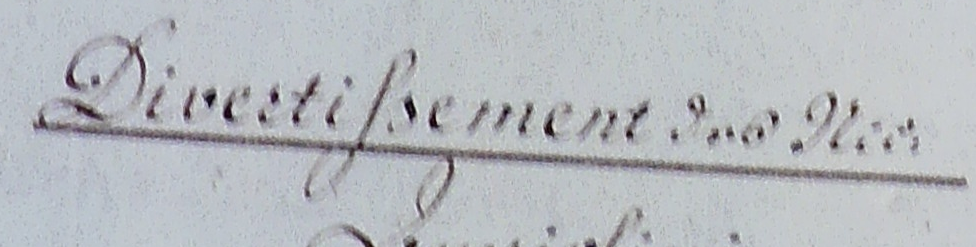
Divertissment des Nic:
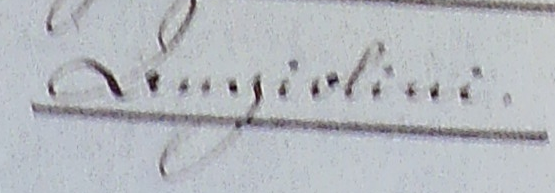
Angiolini.
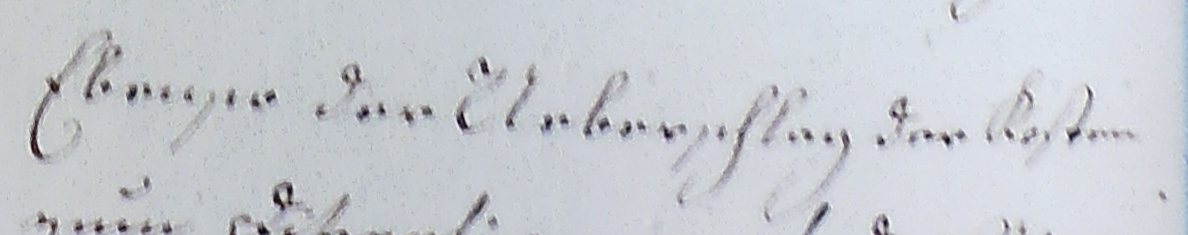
Ebenso der Ueberschlag der Resten
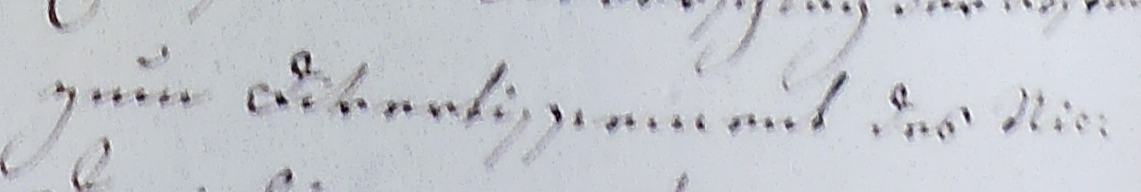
zum Divertissement des Nic:
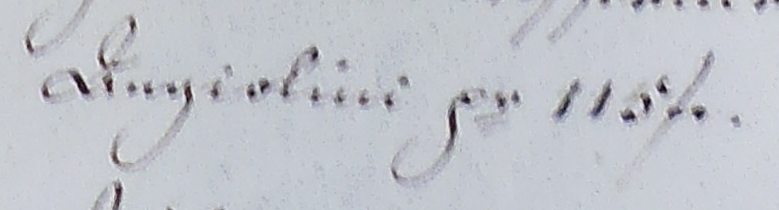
Angiolini pr͇ 115fr.
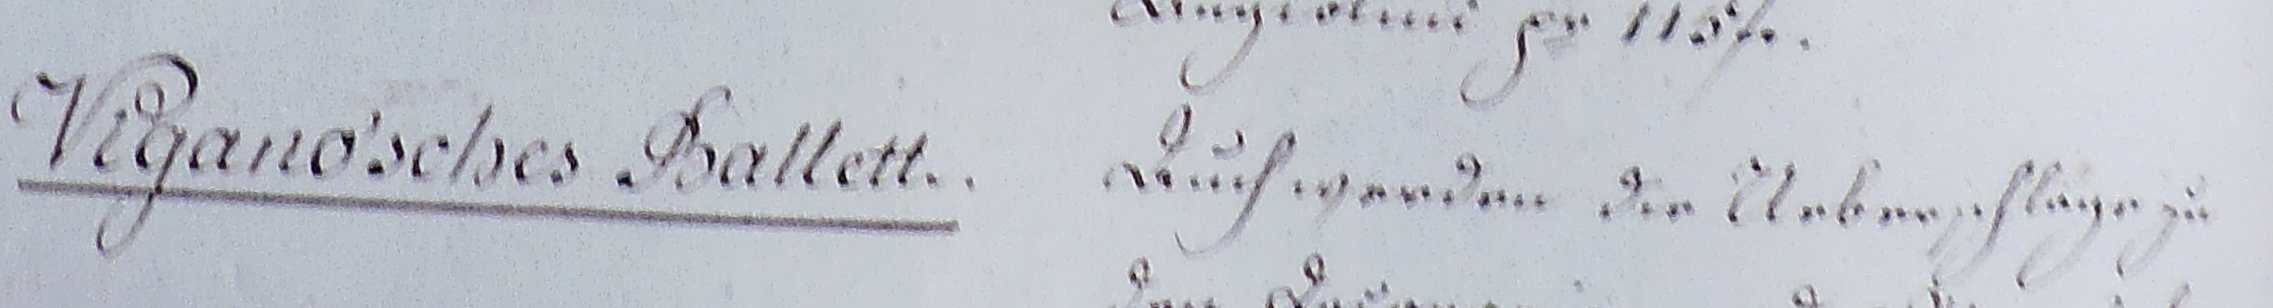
Vigano'sches Ballett. Auch werden die Ueberschläge zu
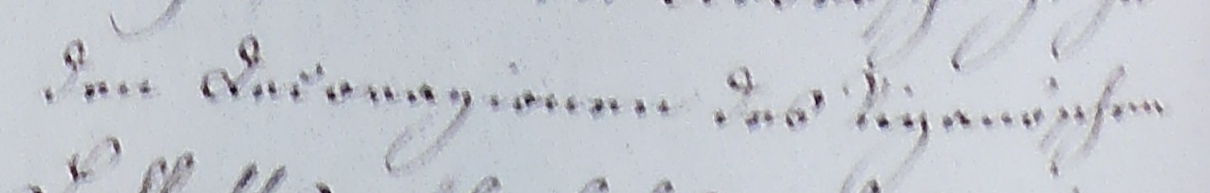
den Decorazionen des Vigano'schen
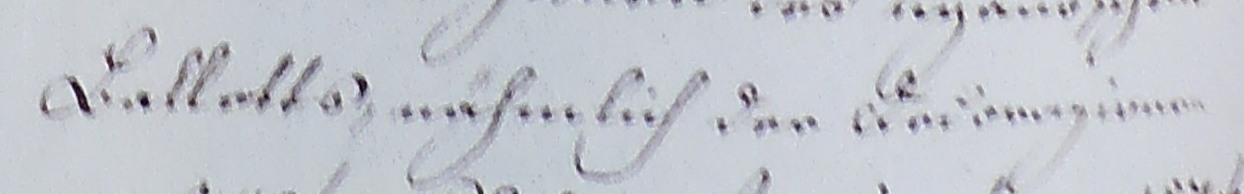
Balletts, nähmlich der Decoracionen
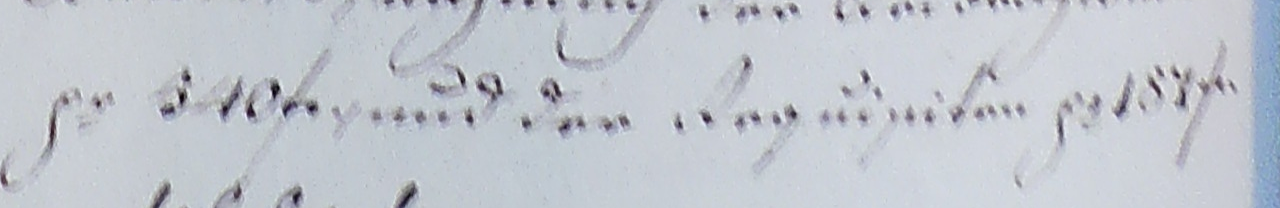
pr͇ 540fr., und der Requisiten pr͇ 187fr.
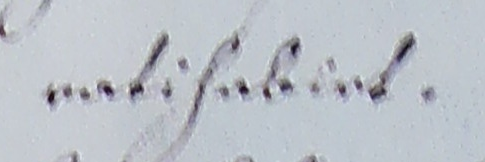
ratihabirt.
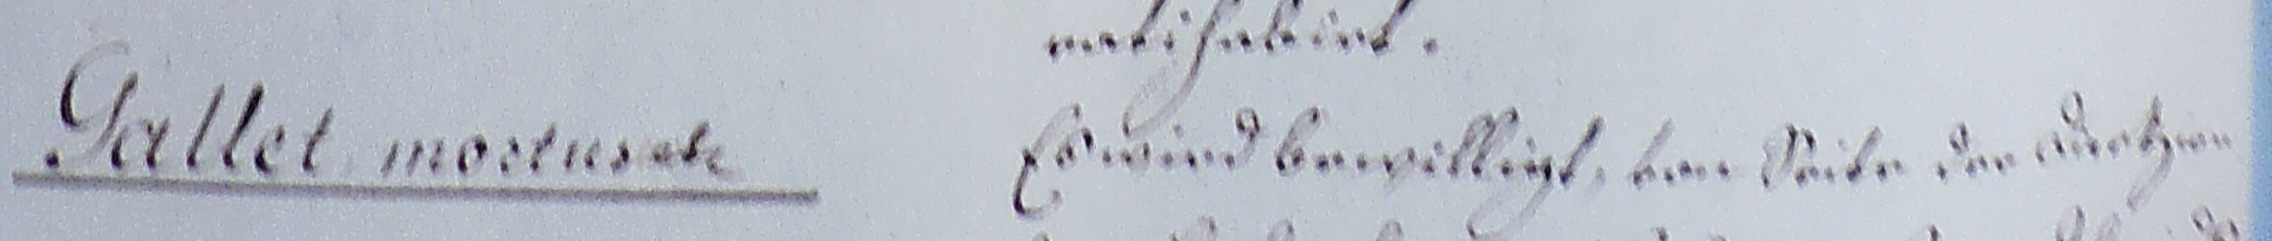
Gallet mortus etc. Es wird bewilligt, von Seite der Direkzion
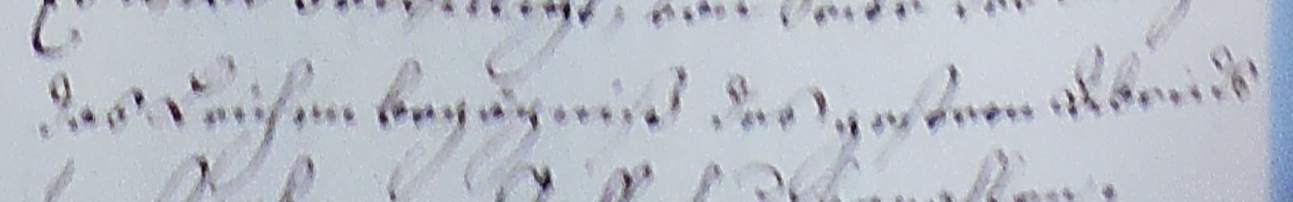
das Leichenbegägniß des gestern Abends
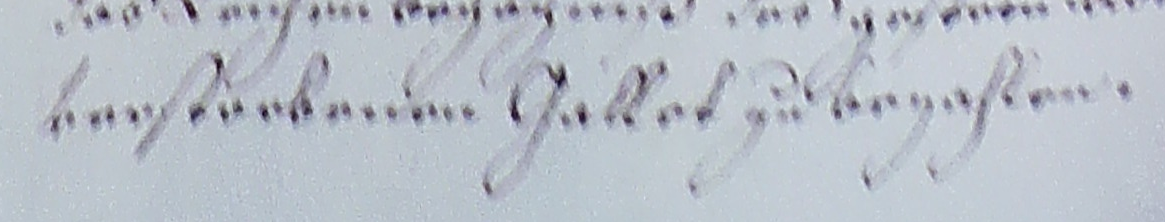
verstorbenen Gallet zu bezahlen.
